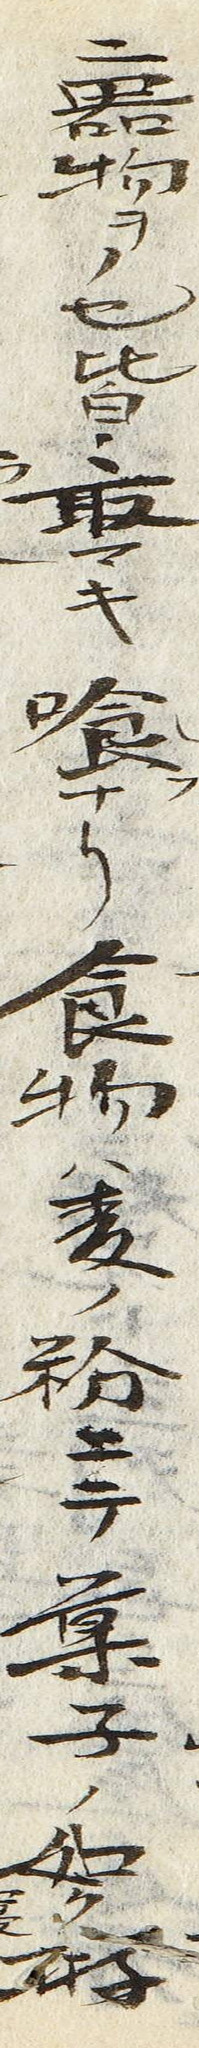ニ器物ヲノセ皆々取マキ喰フナリ食物ハ麦ノ粉ニテ菓子ノ如ク拵
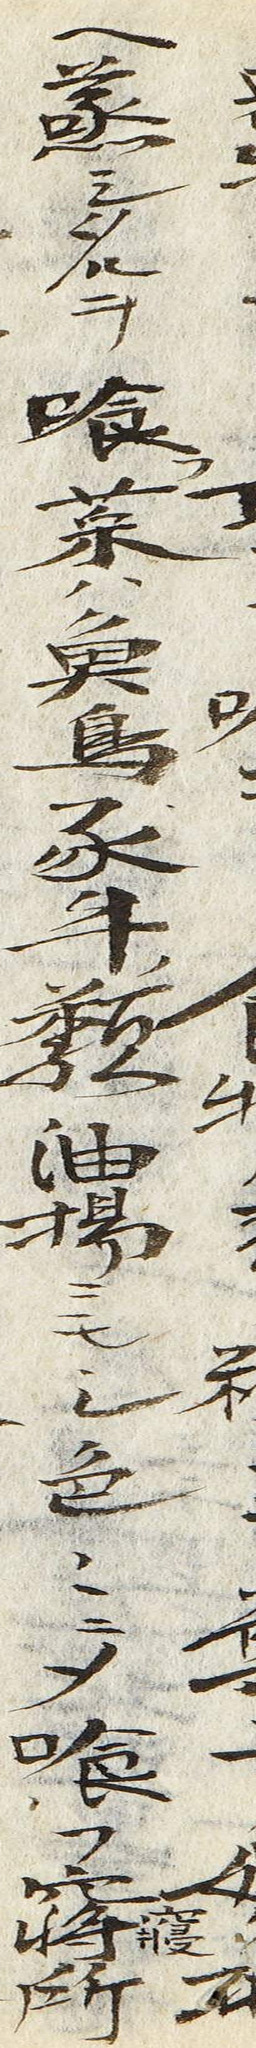ヘ蒸シタルヲ喰フ菜ハ魚鳥豚牛類油揚ニモシ色々ニ〆喰フ所
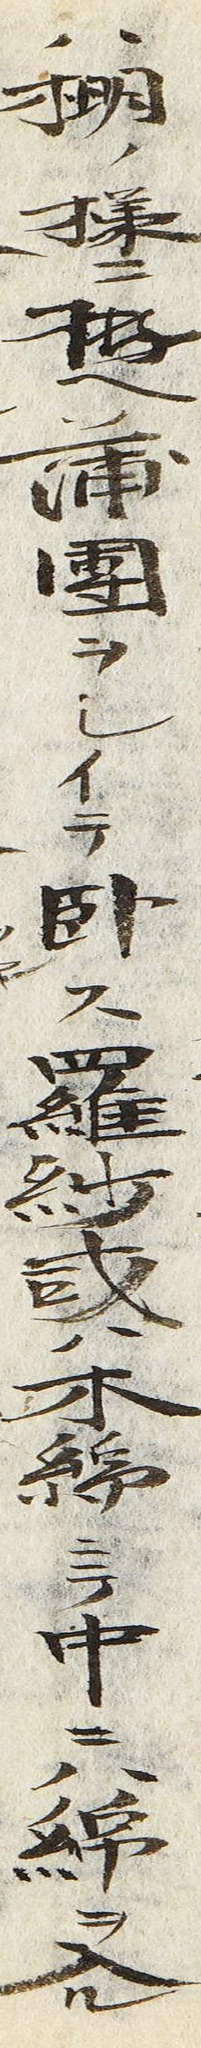ハ棚ノ様ニ拵ヘ蒲団ヲシイテ臥ス羅紗或ハ木綿ニテ中ニハ綿ヲ入ル
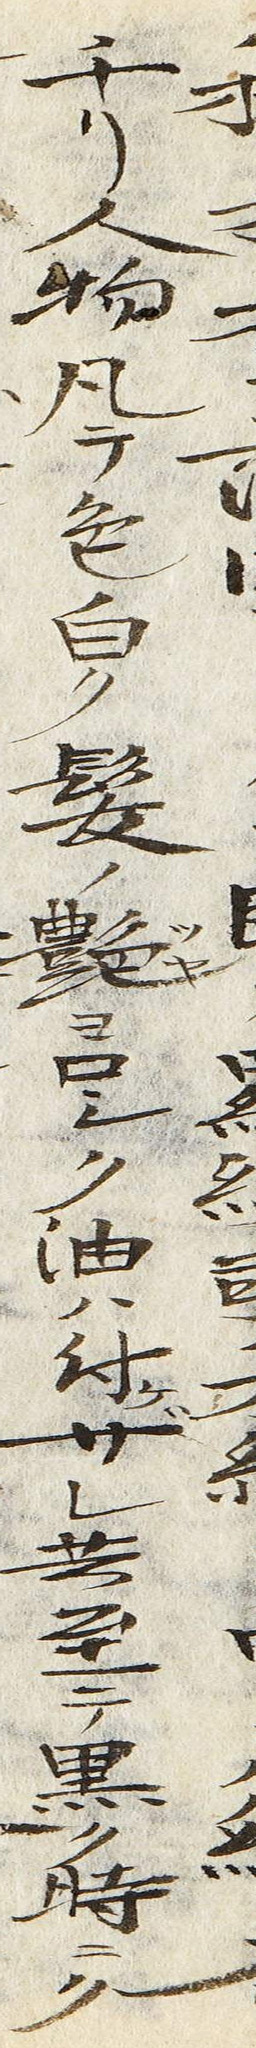ナリ人物凡テ色白ク髪ノ艶ヨロシク油ハ付ケザレ共至テ黒ク時ニク
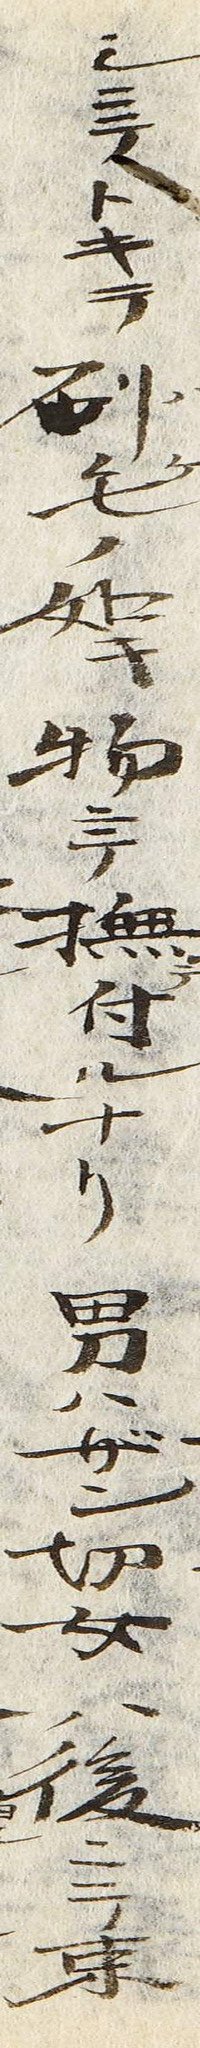シニテトキテ刷毛ノ如キ物ニテ撫テ付ルナリ男ハザン切女ハ後ニテ束
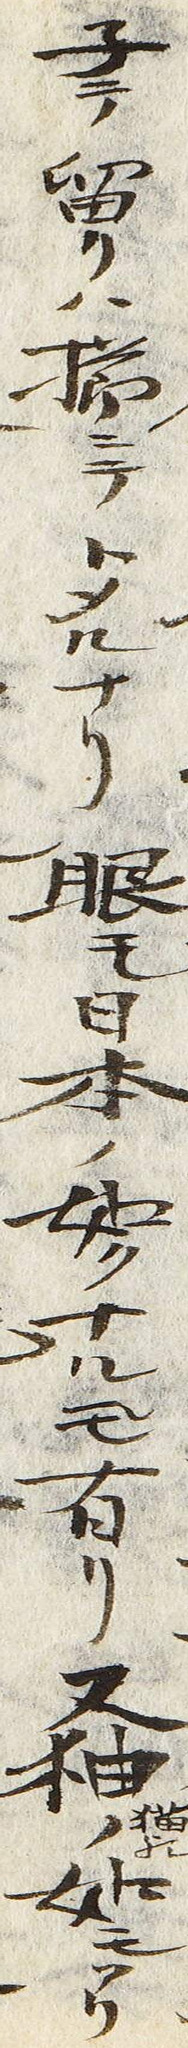ネテ留リハ櫛ニテトメルナリ眼モ日本ノ如クナルモ有リ又狸ノ如モアリ
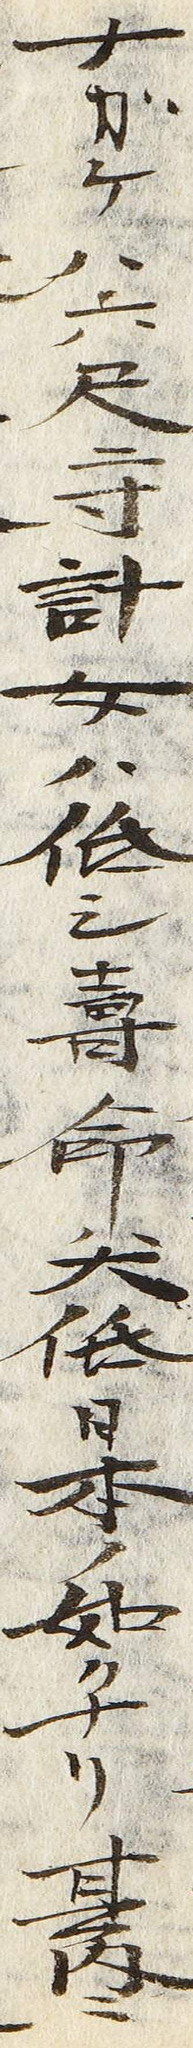ナガケハ六尺二寸計女ハ低シ寿命ハ大抵日本ノ如クナリ其内ニ
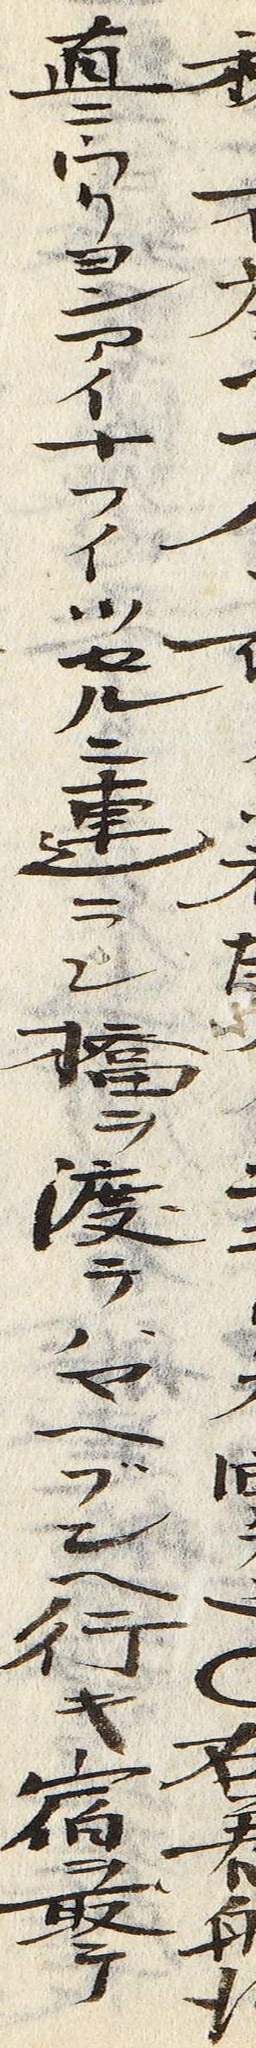直ニウリヨンアイナフイツセルニ連ラン橋ヲ渡テハヤヘブンヘ行キ宿ヲ取テ
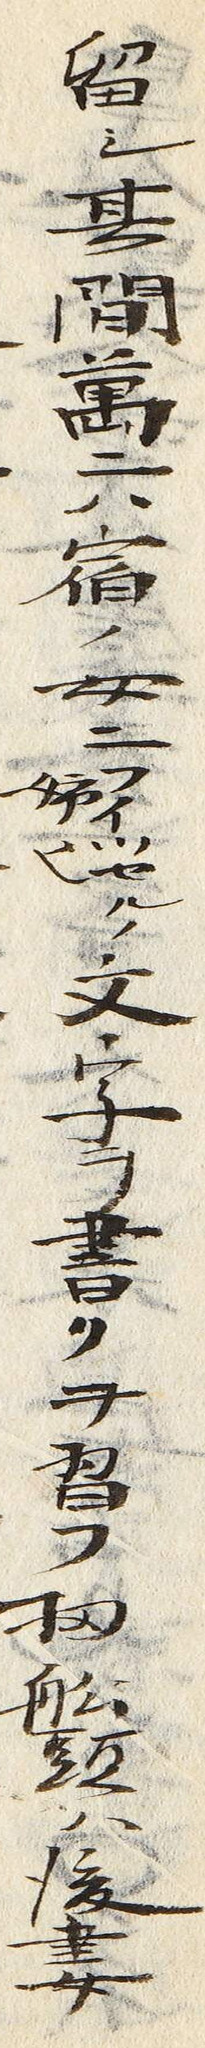留シ其間萬ニハ宿ノ女ニフイツセルノ姉也文字ヲ書クヲ習フ扨船頭ハ後妻
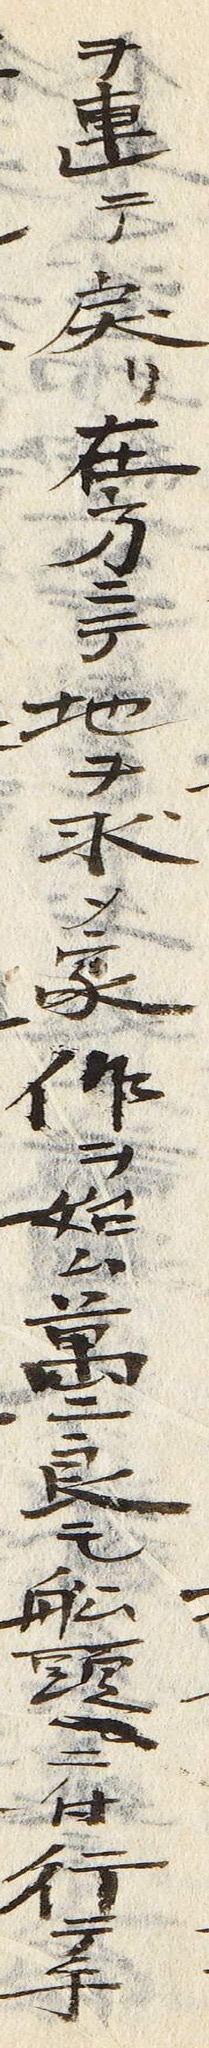ヲ連テ戻リ在方ニテ地ヲ求メ家作ヲ始ム萬二良モ船頭ニ付行テ手
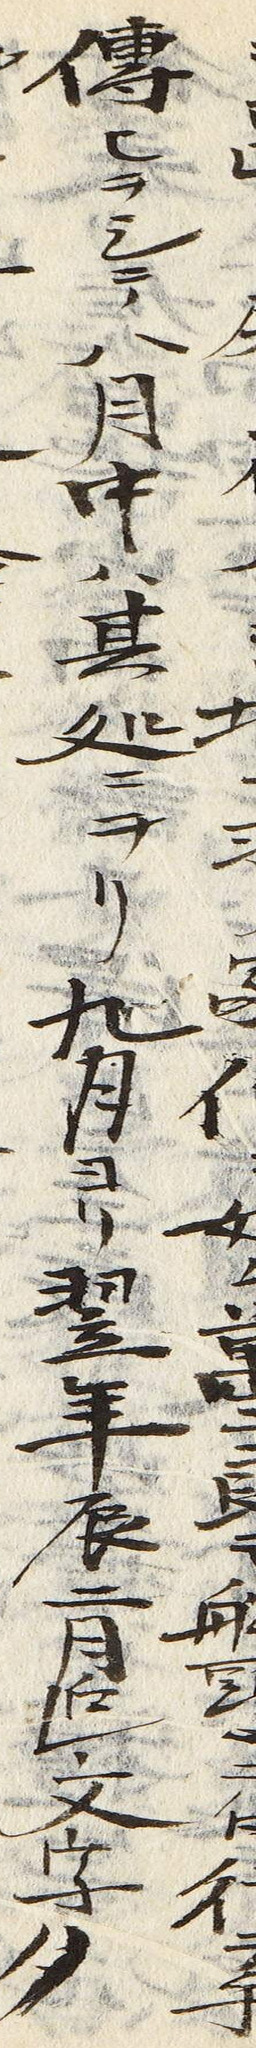伝ヒヲシテ八月中ハ其処ニヲリ九月ヨリ翌年辰二月迄文字
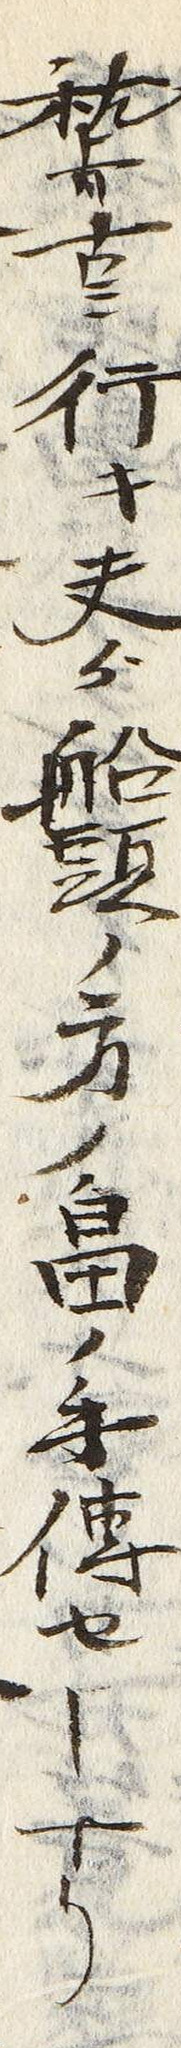稽古ニ行キ夫ゟ船頭ノ方ノ畠ノ手伝セシナリ
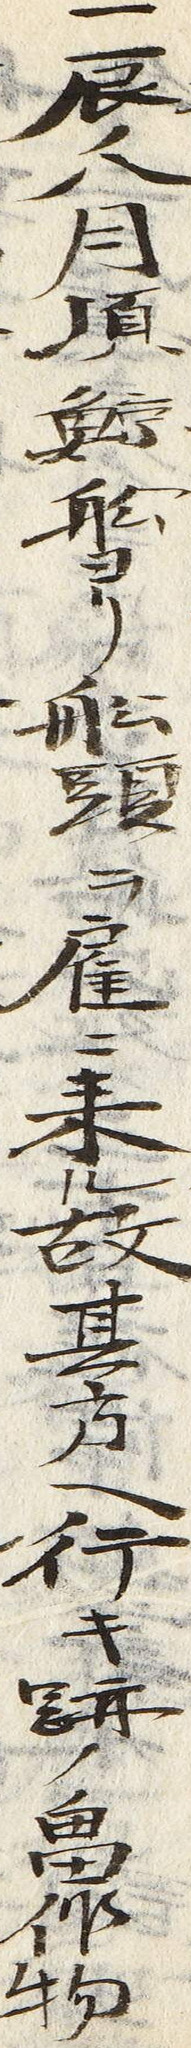一辰ノ八月頃鯨船ヨリ船頭ヲ雇ニ来ル故其方ヘ行跡ノ畠作物
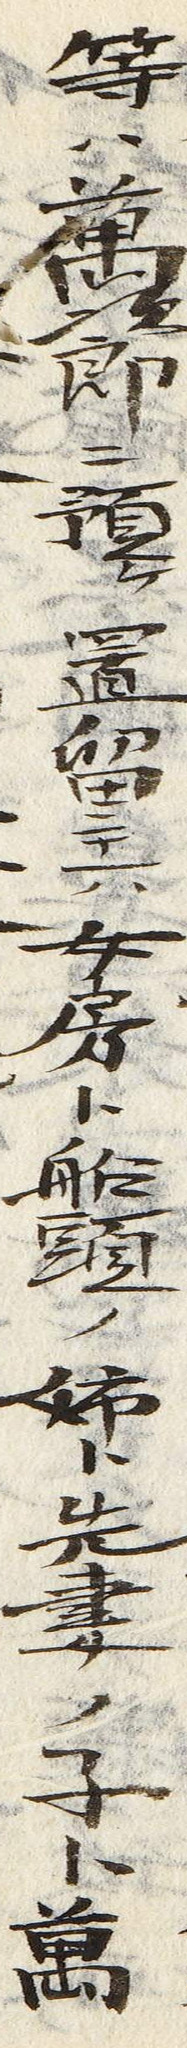等ハ萬次郎ニ預ケ置留主ハ女房ト船頭ノ姉ト先妻ノ子ト萬
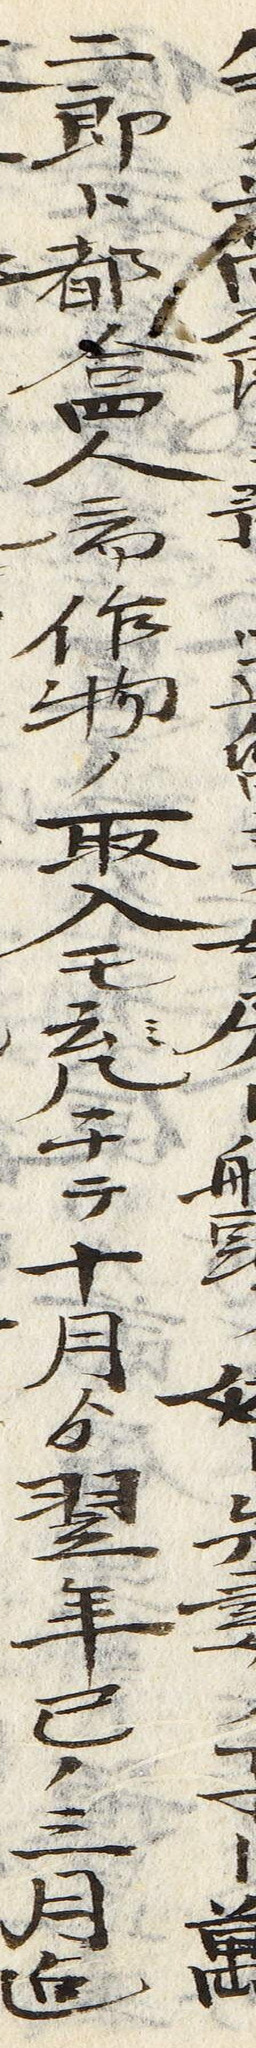二郎ト都合四人ニ而作物ノ取入モ充チテ十月ゟ翌年己ノ三月迄
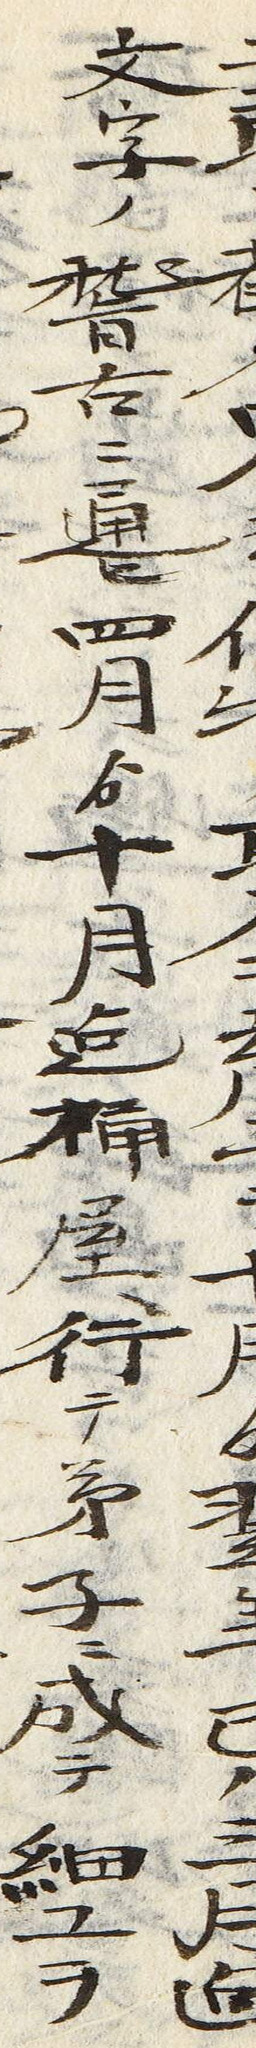文字ノ稽古ニ通ヒ四月ゟ十月迄桶屋ヘ行テ弟子ニ成テ細工ヲ
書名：漂流記聞
